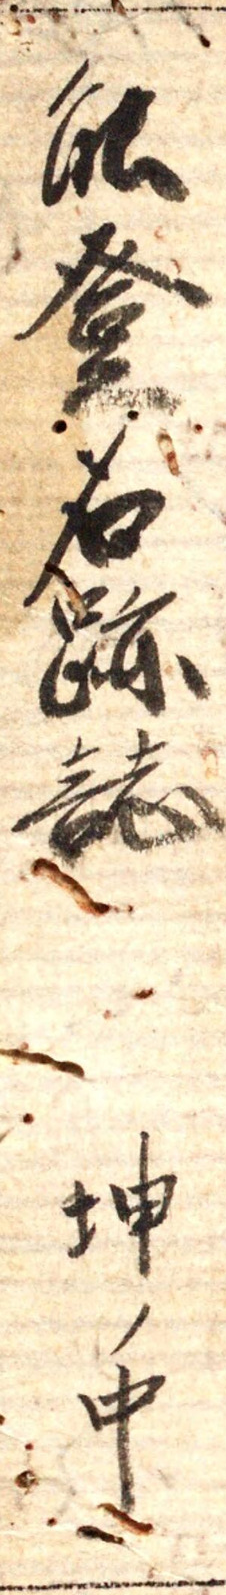能登名跡誌坤ノ中

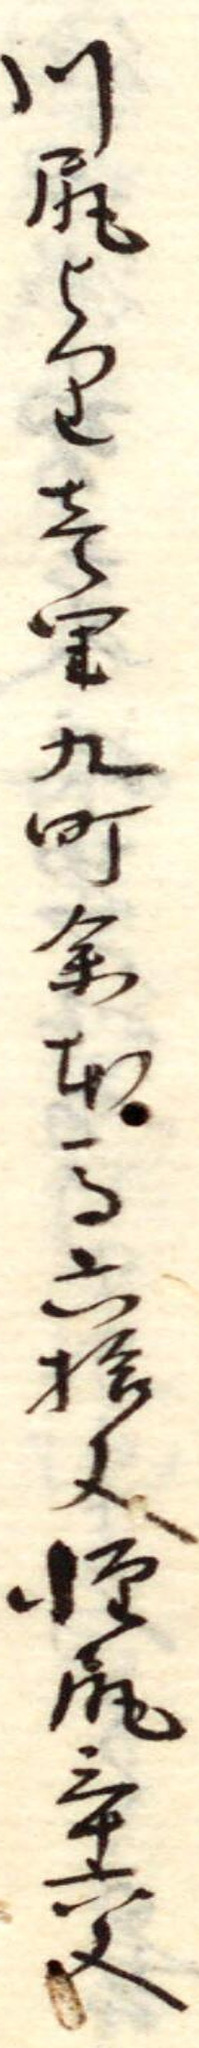川尻より壱里九町余本馬六拾文軽尻三十六文
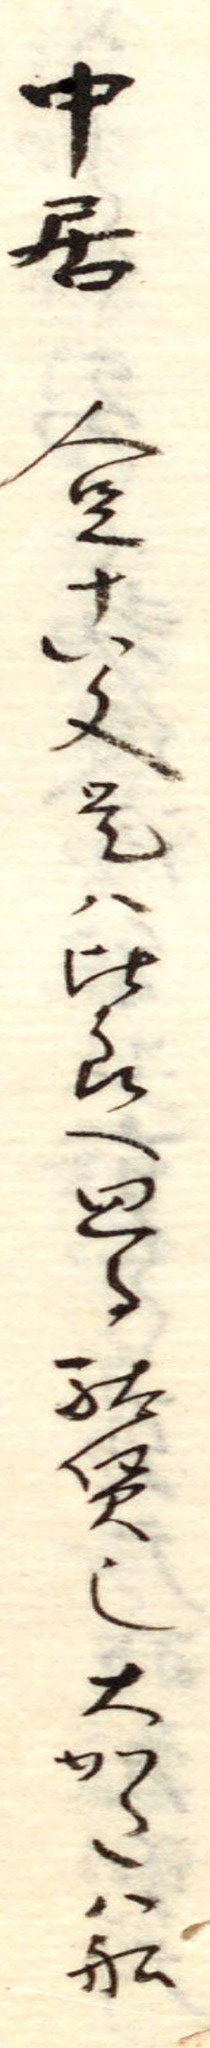中居人足十八文是は比良へ廻る駄賃也大かたは船
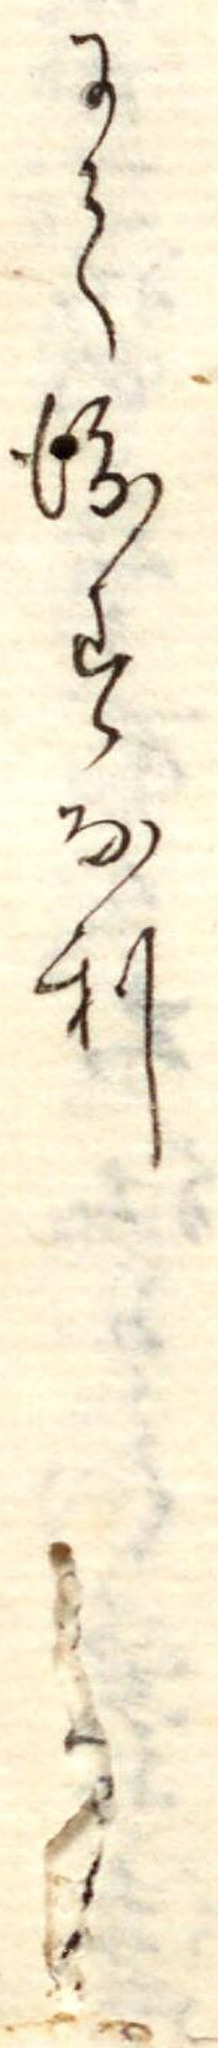にて渡すなり
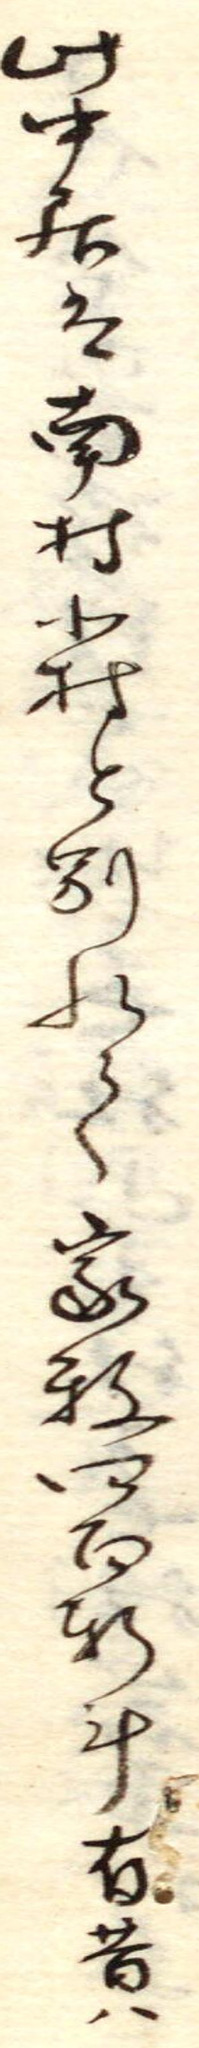此中居は南村北村と別れて家数四百軒計有昔は
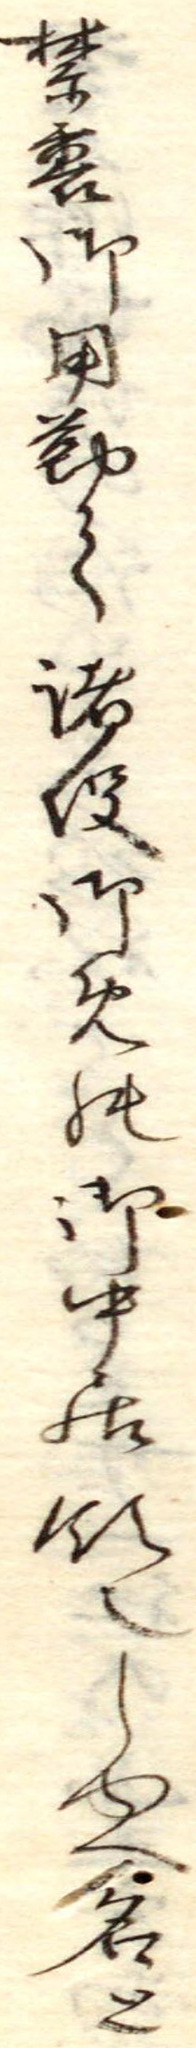禁裏御用勤て諸役御免の御中居領也しゆへ名と
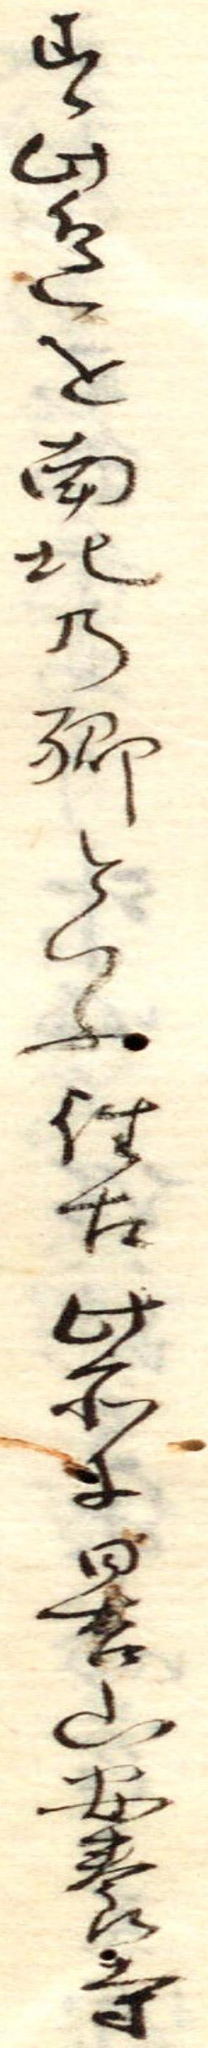す此辺を南北の郷といふ往古此所に日吉山安養寺
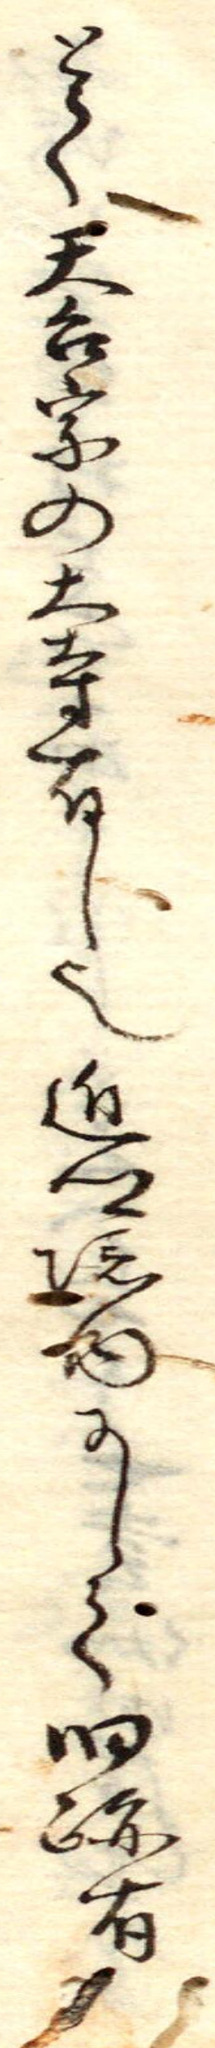とて天台宗の大寺有し也き近郷境内にて旧跡有

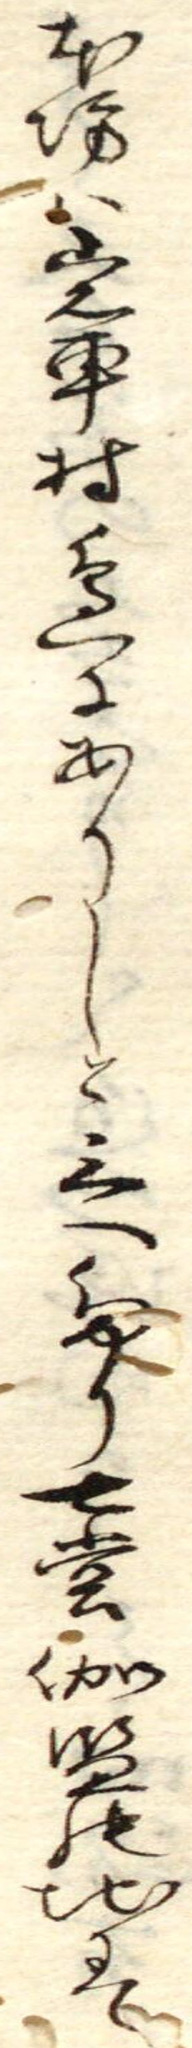本坊は岩車村辺にありしと云へたり七堂伽藍の地にて
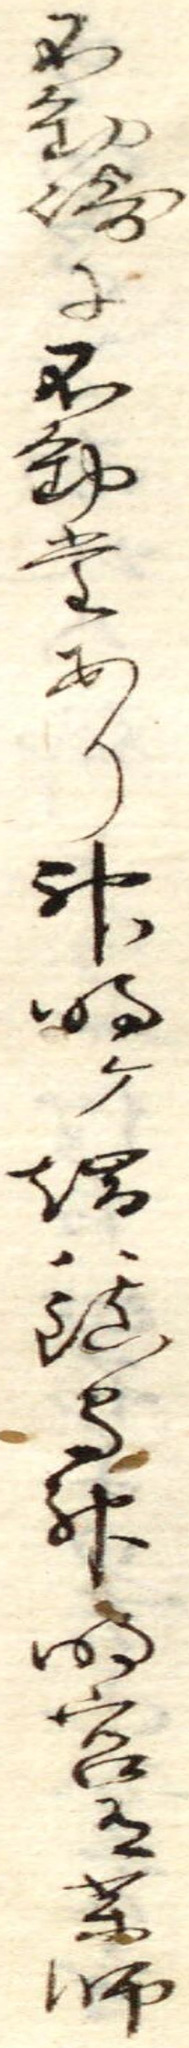不動崎に不動堂あり神明ヶ端は鎮守神明宮有薬師
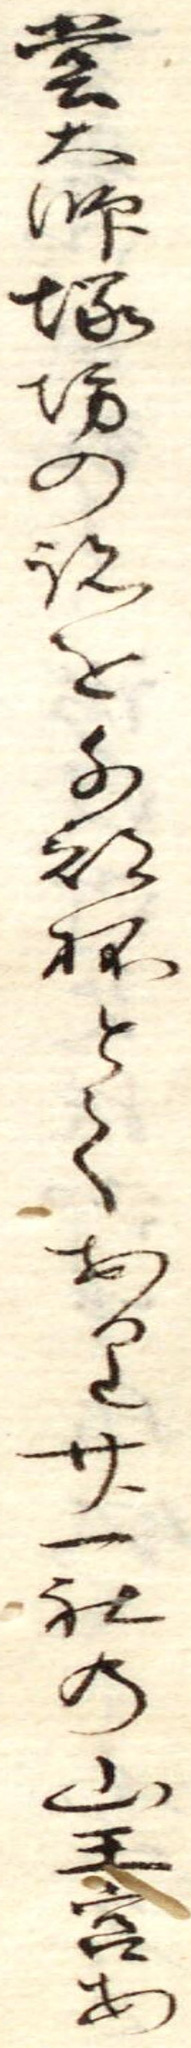堂大師塚坊の跡を千期抔とてあり廿一社の山王宮あ
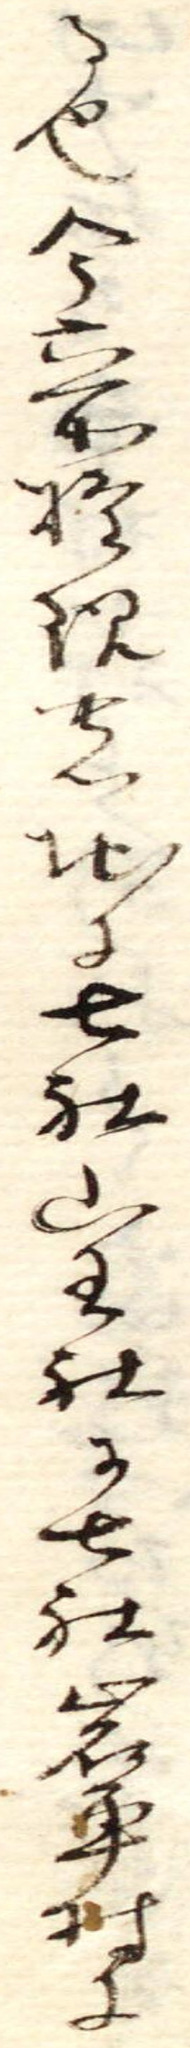る也今六所権現の地に七社山王社に七社岩車村に
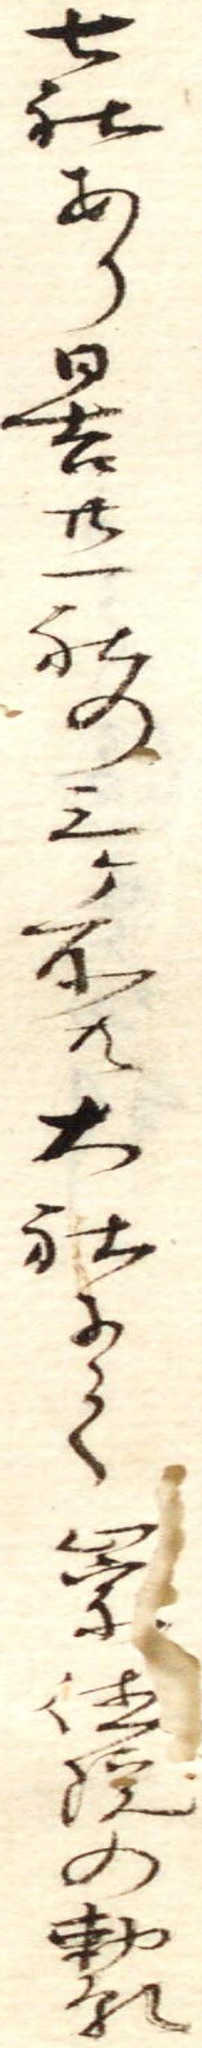七社あり日吉廿一社の三ヶ所共大社にて崇徳院の勅願
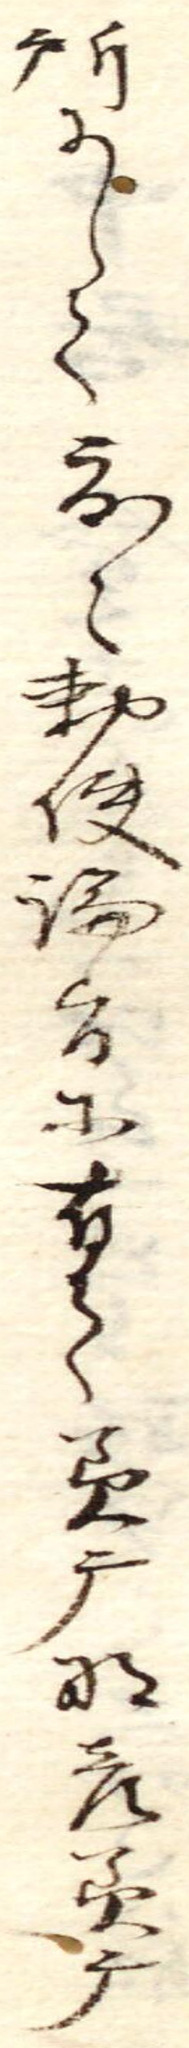所にて度々勅使論旨抔有て美摩那彦美摩
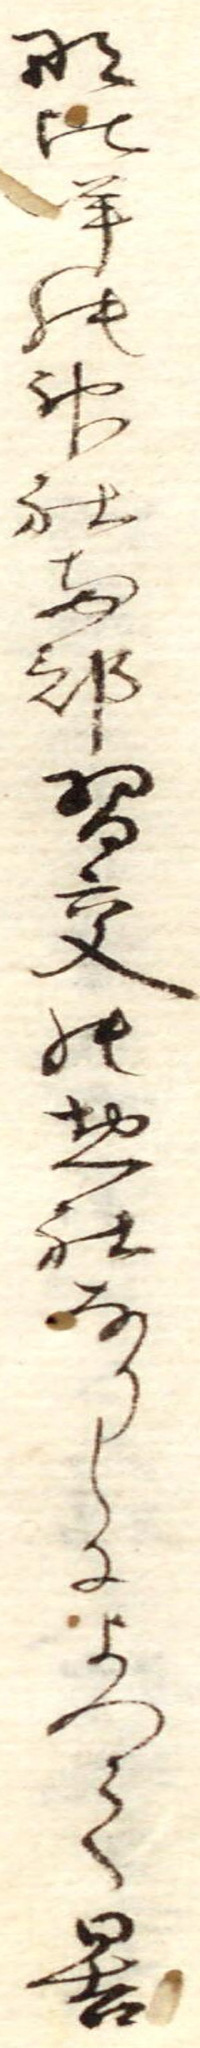那比咩の神社両郡習交の惣社なりしによつて日吉
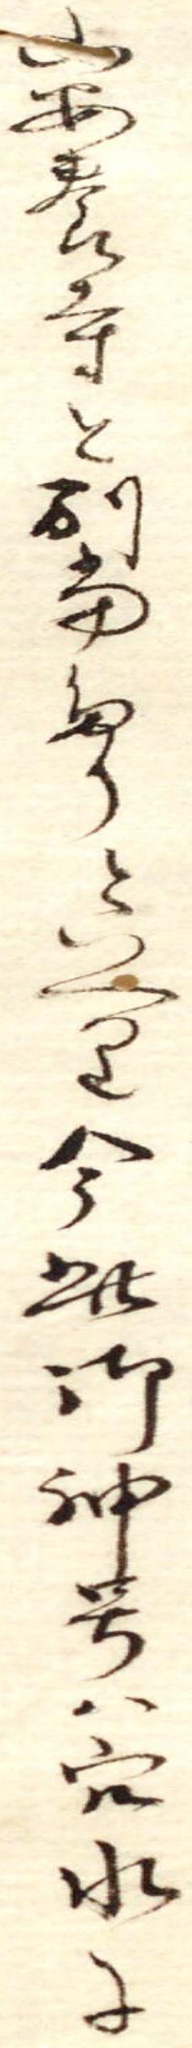山安養寺と別当たりといへり今此御神号は穴水に
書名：能登名跡誌
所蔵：Ishikawa Prefectural Library
